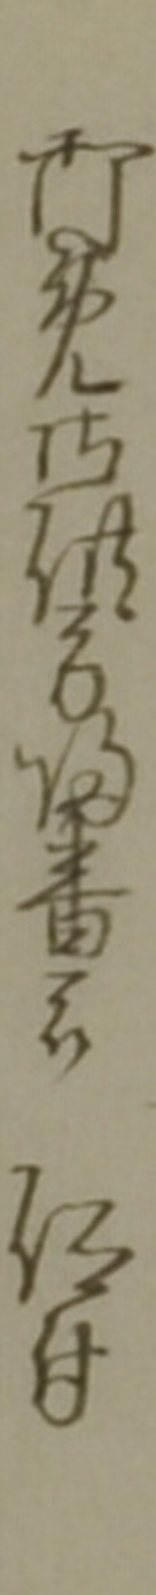御免御供方帰番被仰付
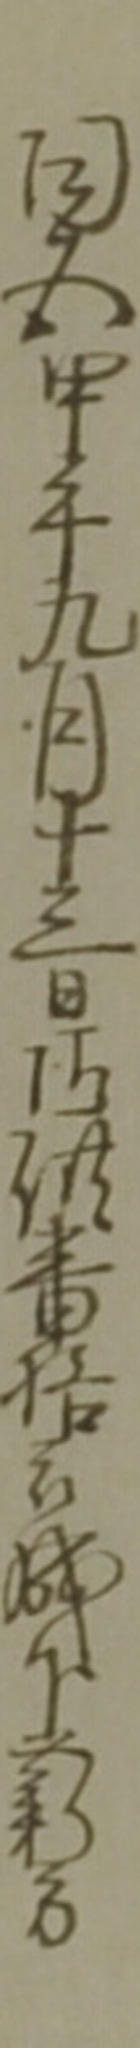一同五甲午九月十三日御供番格被成下薪方
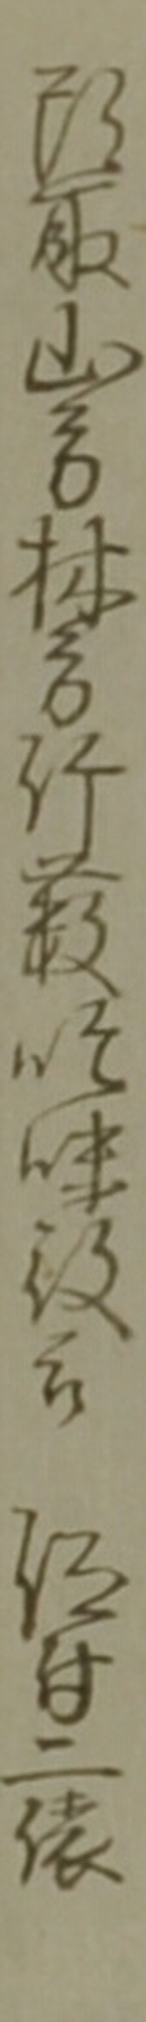頭取山方林方竹薮吟味役被仰付二俵
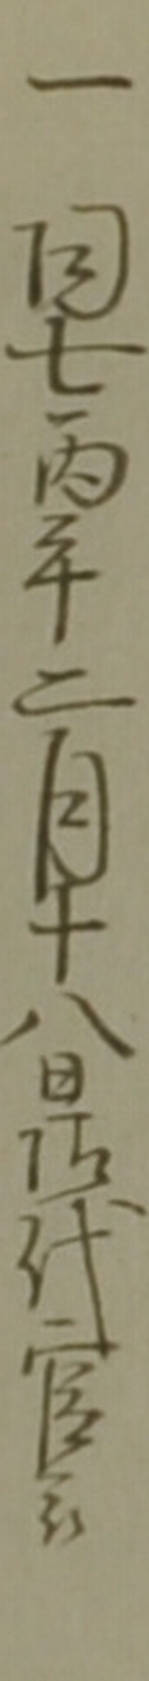一同七丙午二月十八日御代官被
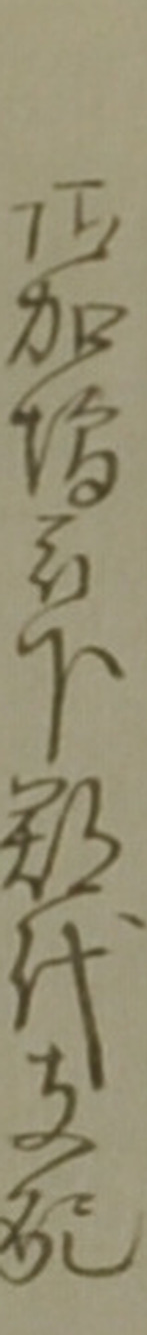御加増被下郡代支配

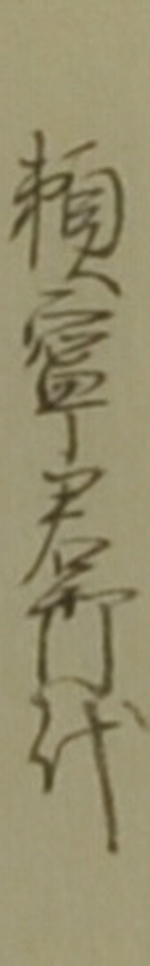頼寧君御代
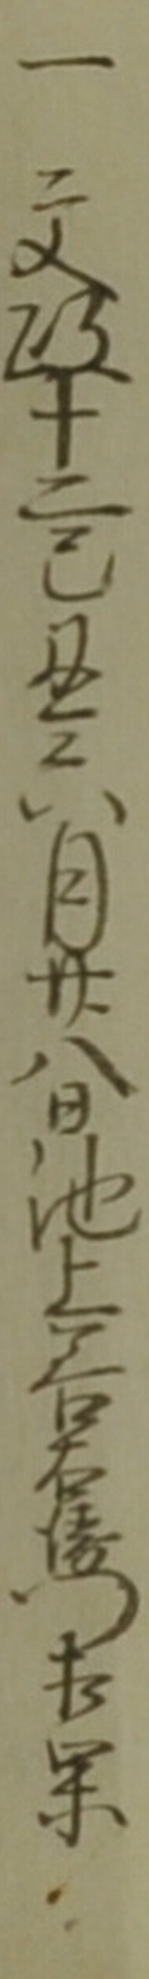一文政十二己丑六月廿八日池上善右衛門相◻︎
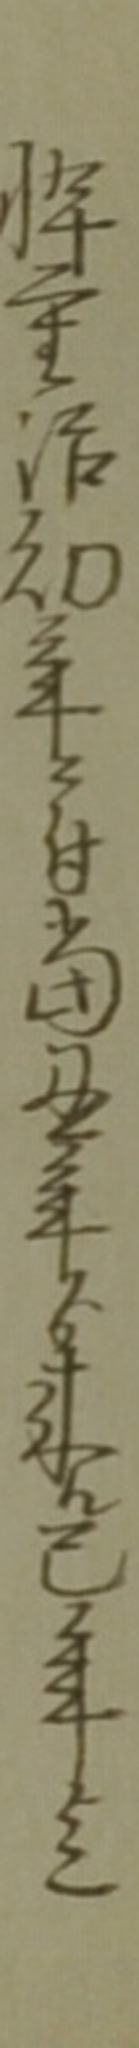忰重治初年ニ付当丑年ゟ来ル巳年迄
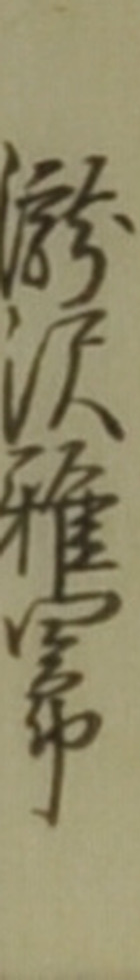瀧沢雅四郎
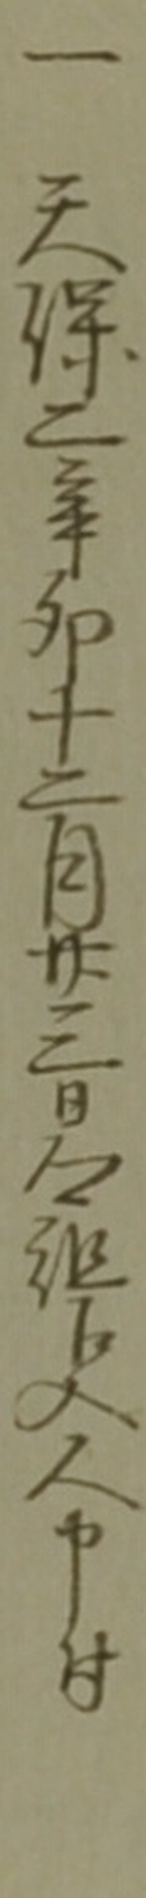一天保二辛卯十二月廿三日郷組江入人申付
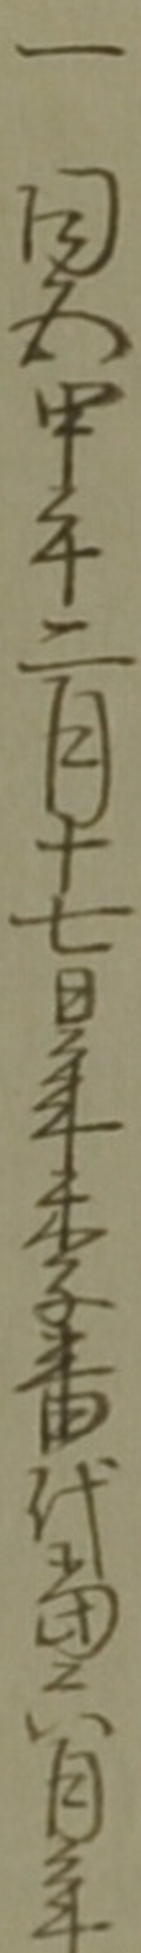一同五甲午二月十七日年季番代当六月年
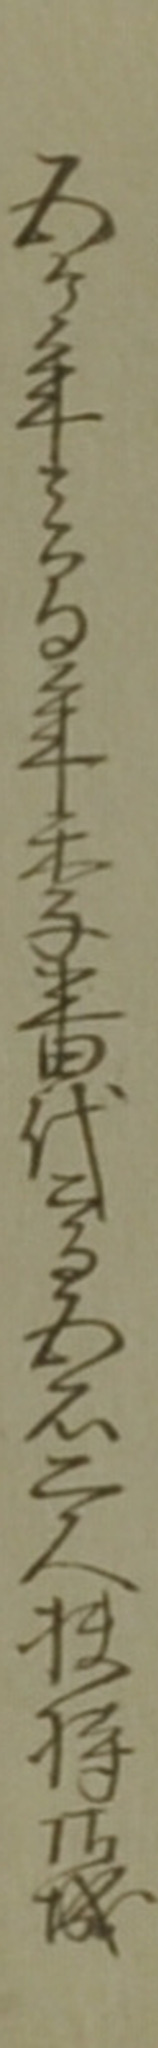五ヶ年之間年季番代高五石二人扶持御城
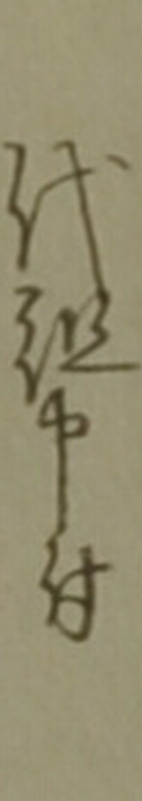代組申付
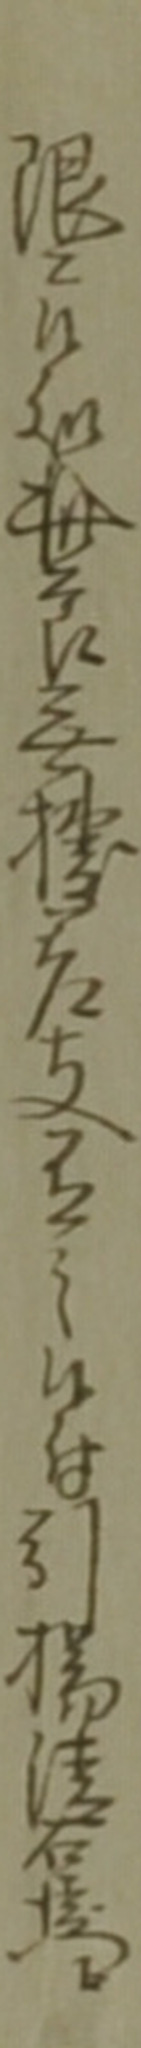限ニ候処此節無拠差支有之候付引揚清右衛門江
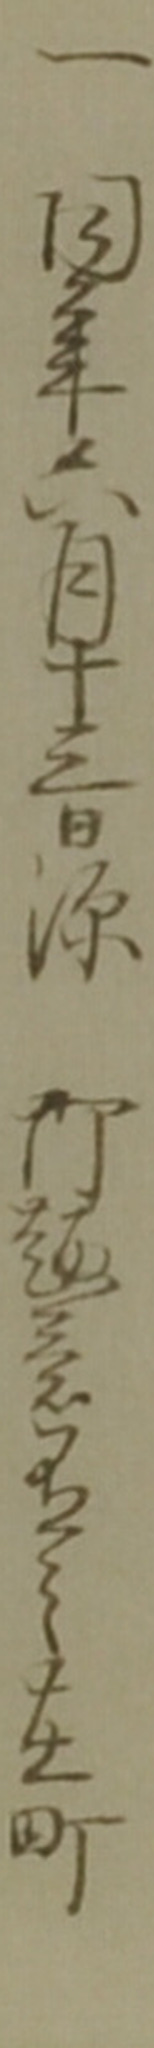一同年六月十三日源御趣意有之在町
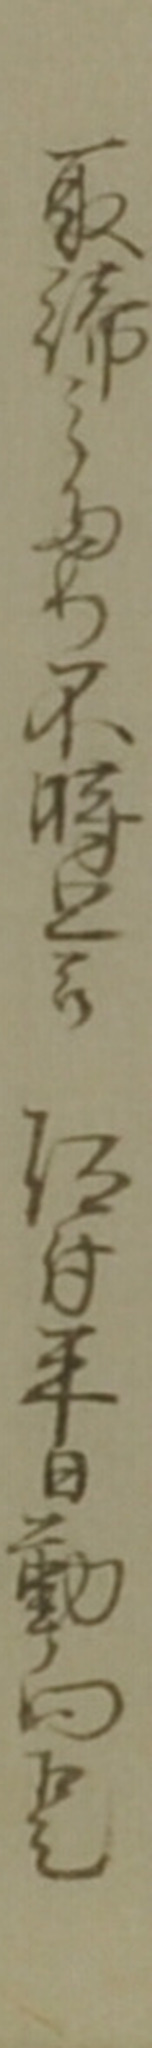取締之多め不時廻被仰付平日勤向是
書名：無足諸士勤仕録（七）
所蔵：伊那市立高遠町図書館・合同会社AMANE
